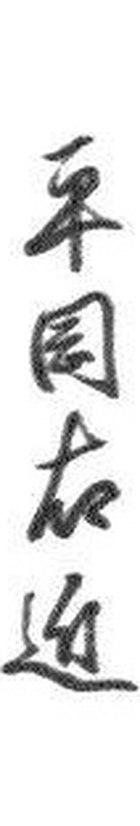平岡右近

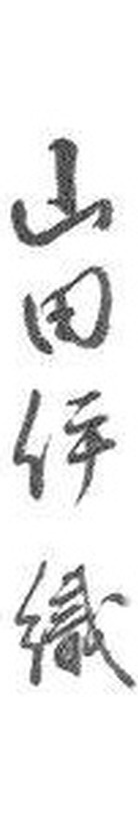山田伊織
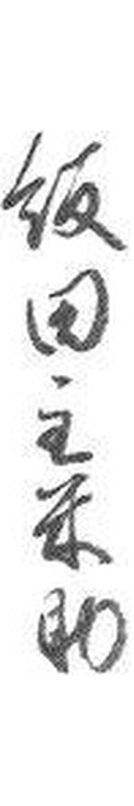飯田主米助
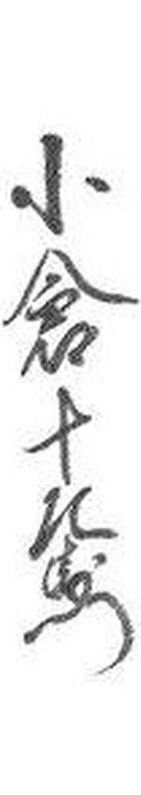小倉十左衛門
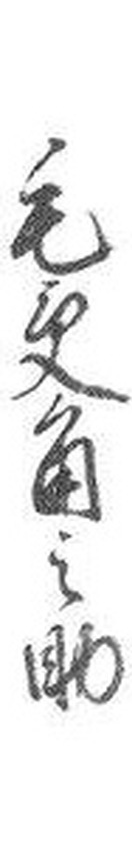毛受角之助
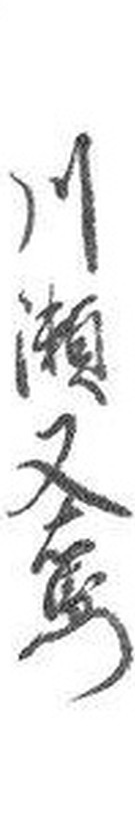川瀬又右衛門
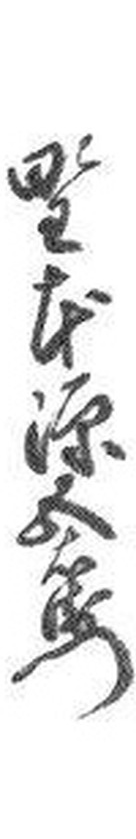野本源五右衛門
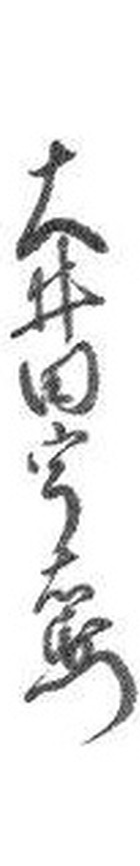大井田宇右衛門
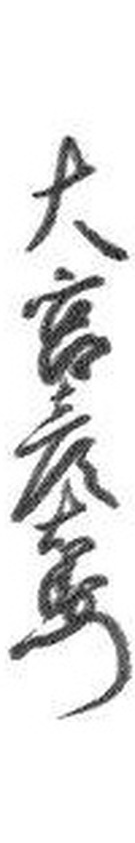大宮彦右衛門
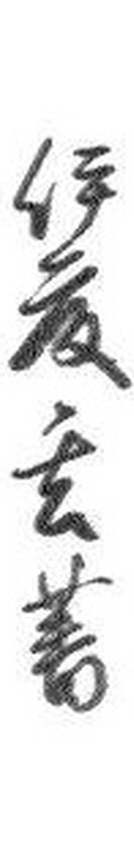伊藤玄蕃
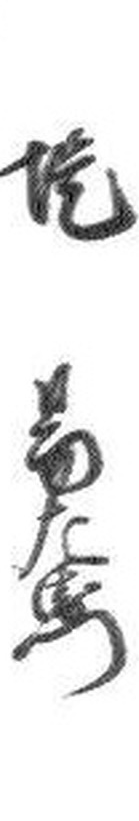堤易左衛門
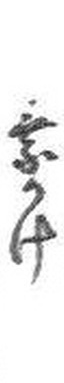乗かけ
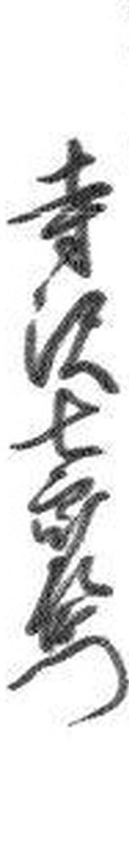寺沢七郎左衛門
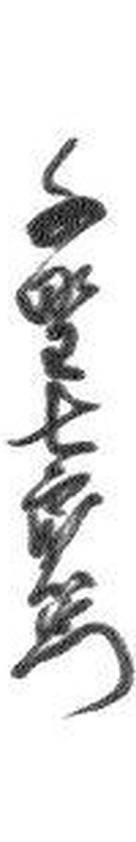千野七郎右衛門
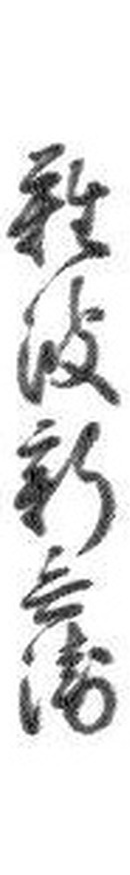難波新兵衛
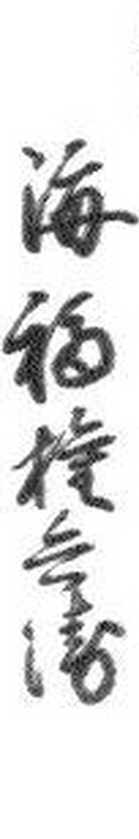海福権兵衛
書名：家譜 四 忠昌公 従寛永七年到正保四年
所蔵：福井県文書館 Fukui Prefectural Archives
